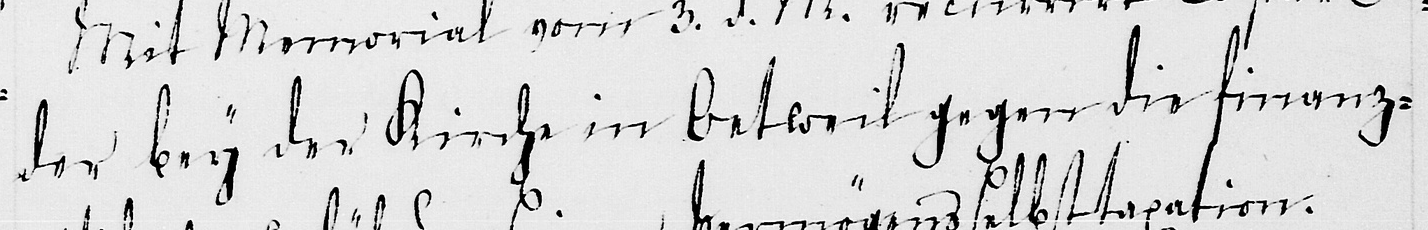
der bey der Kirche in Oetweil gegen die finanz¬
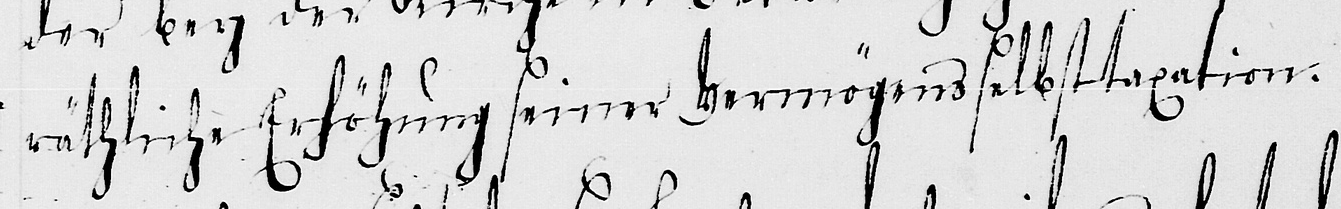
räthliche Erhöhung seiner Vermögensselbsttaxation.
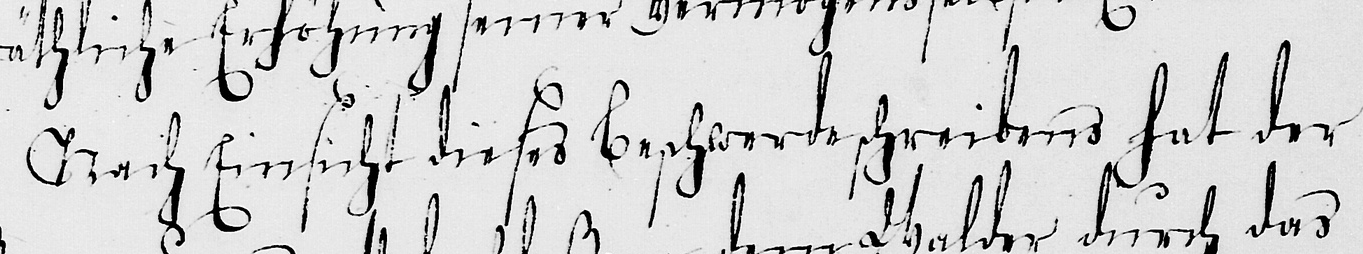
Nach Einsicht dieses Beschwerdeschreibens hat der
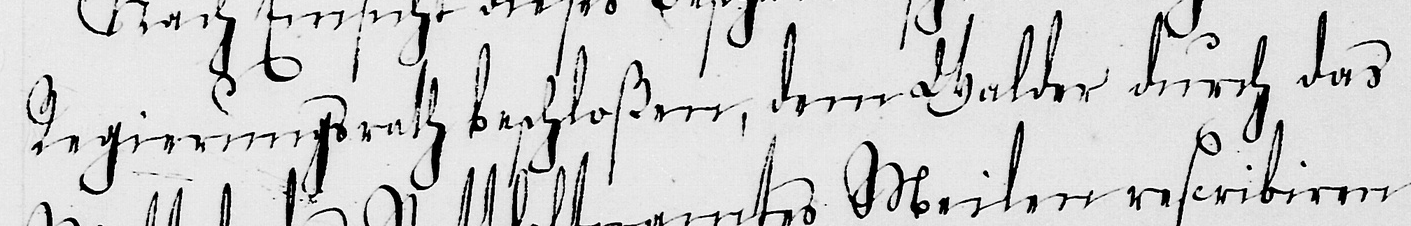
Regierungsrath beschloßen, dem Walder durch das
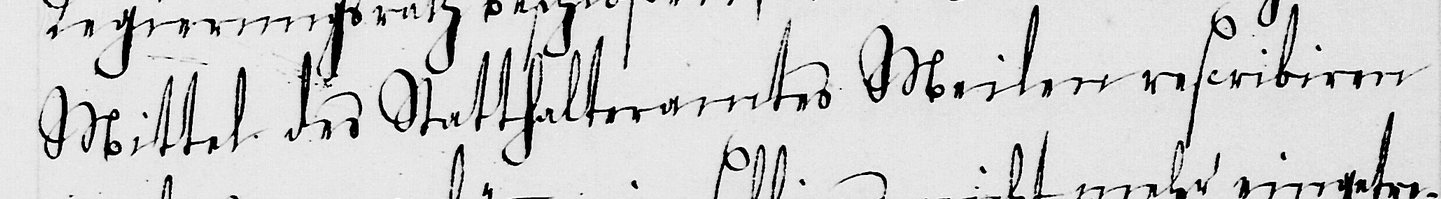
Mittel des Statthalteramtes Meilen rescribiren
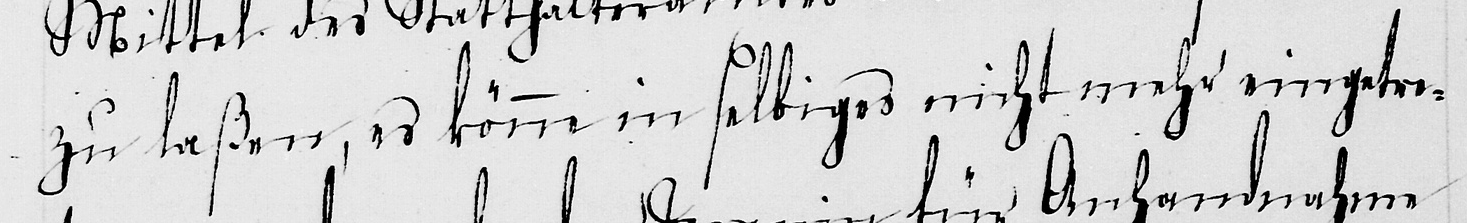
zu laßen, es könne in selbiges nicht mehr eingetre¬
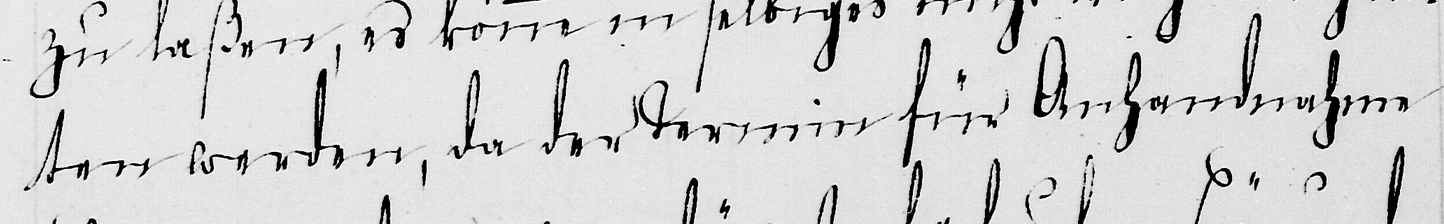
ten werden, da der Termin für Anhandnahme
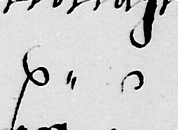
be¬
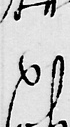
1.
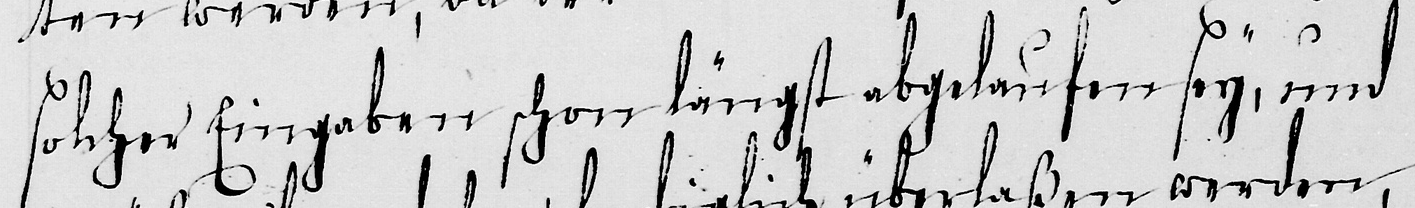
solcher Eingaben schon längst abgelaufen sey, und
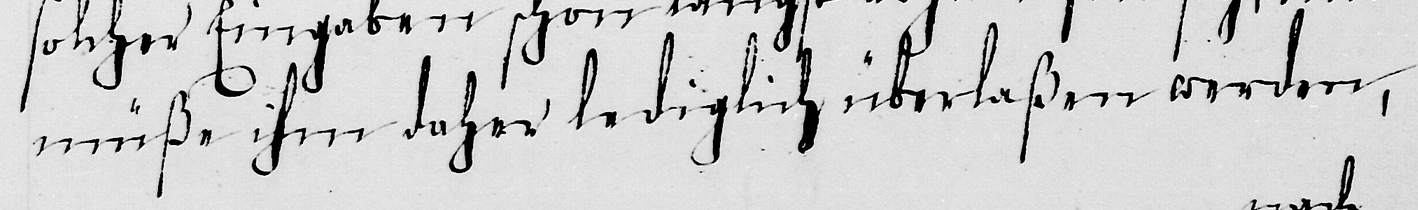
müße ihm daher lediglich überlaßen werden,
